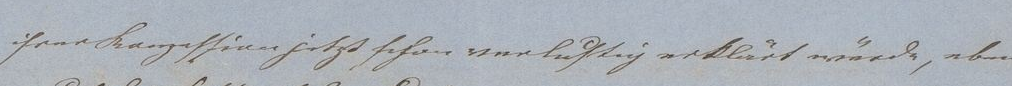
ihrer Konzession jetzt schon verlustig erklärt würde, eben
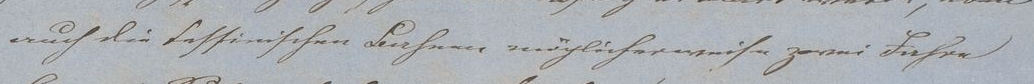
auch die tessinischen Bahnen möglicherweise zwei Jahre
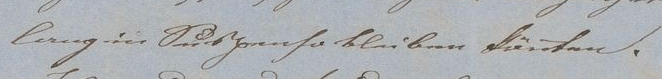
lang in Suspenso bleiben könnten.
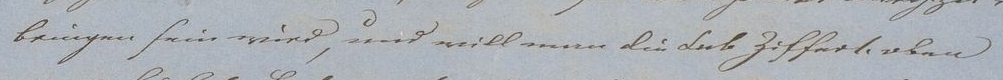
bringen sein wird, und will man die sub Ziffer 1. oben
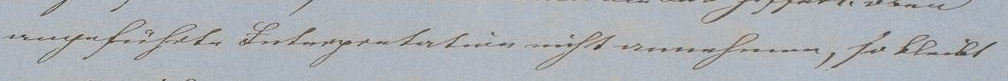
angeführte Interpretation nicht annehmen, so bleibt
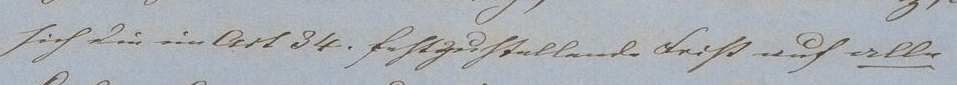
sich die in Art 34. festzustellende Frist auf alle
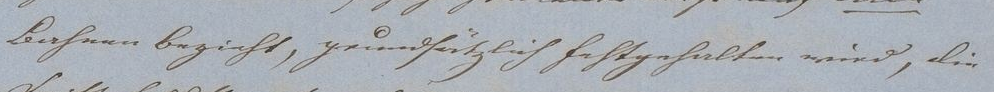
Bahnen bezieht, grundsätzlich fesgehalten wird, die
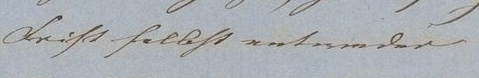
Fist selbst entweder
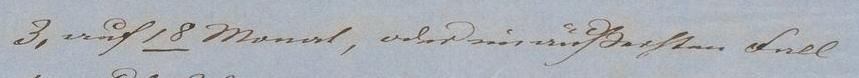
3. auf 18 Monat, oder im äußersten Fall
